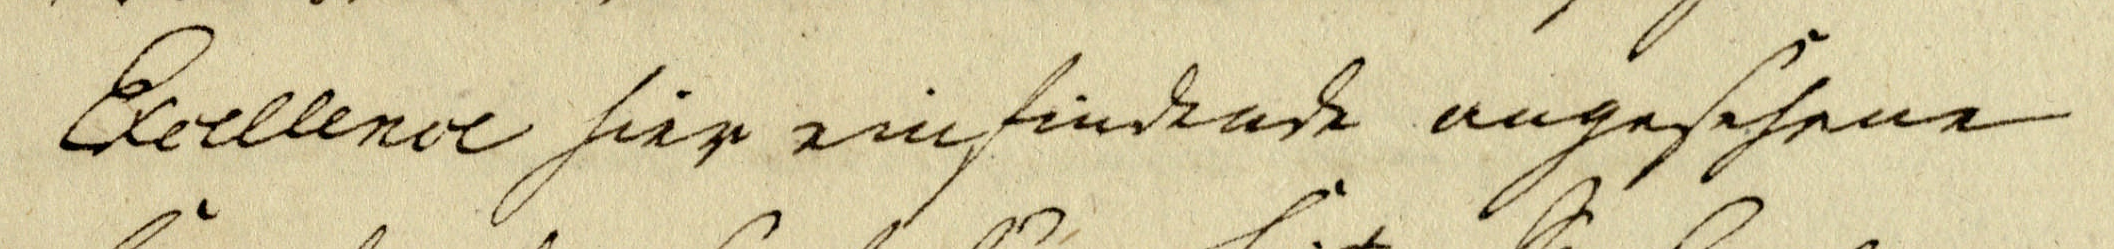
Excellence hier einfindende angesehene
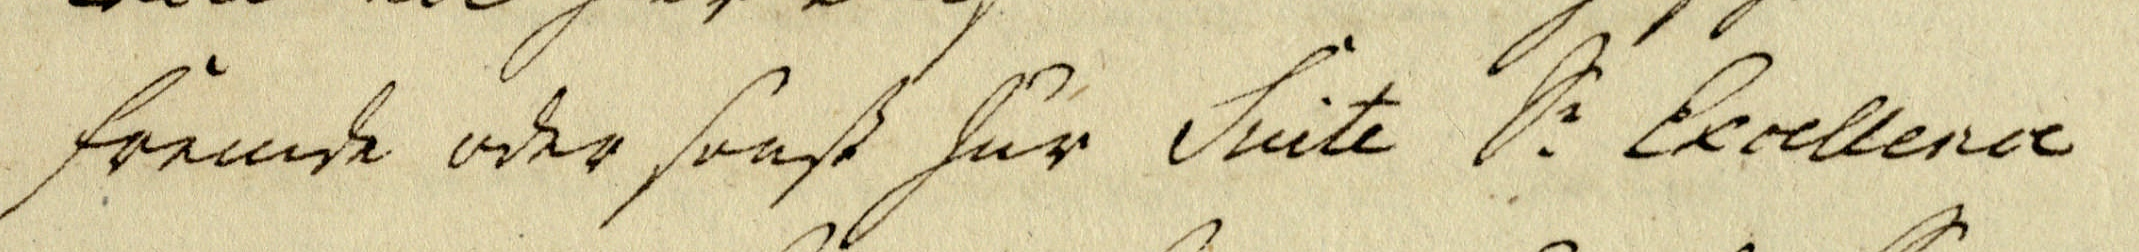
Fremde der sonst zur Suite Sr Excellence
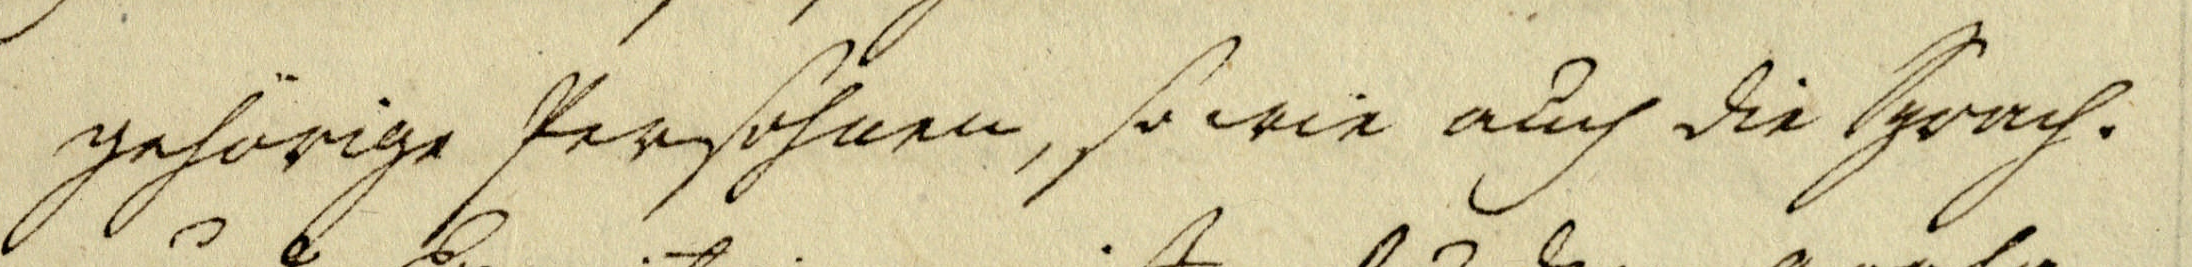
gehörige Persohnen, so wie auch die Sprach-
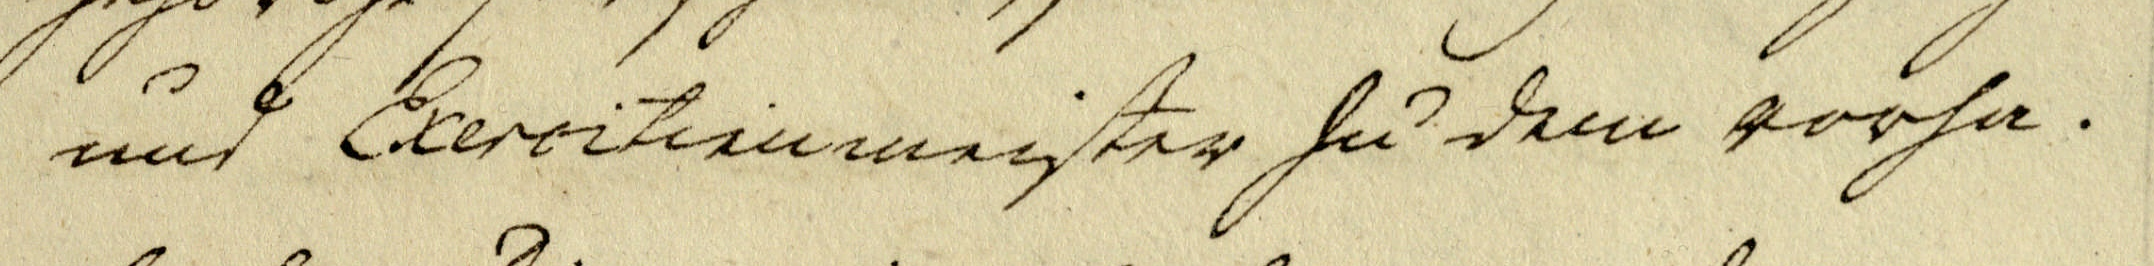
und Exercitienmeister zu dem vorha¬
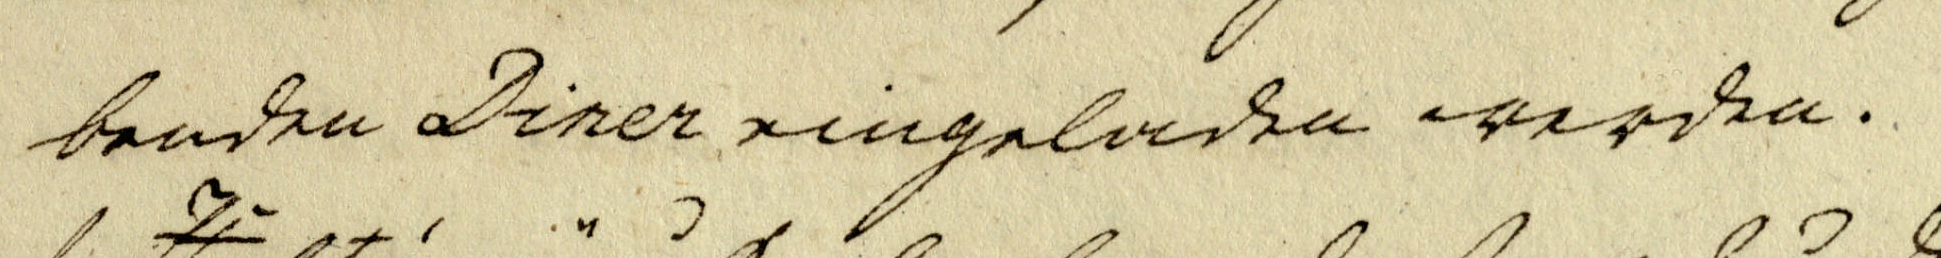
benden Diner eingeladen werden.
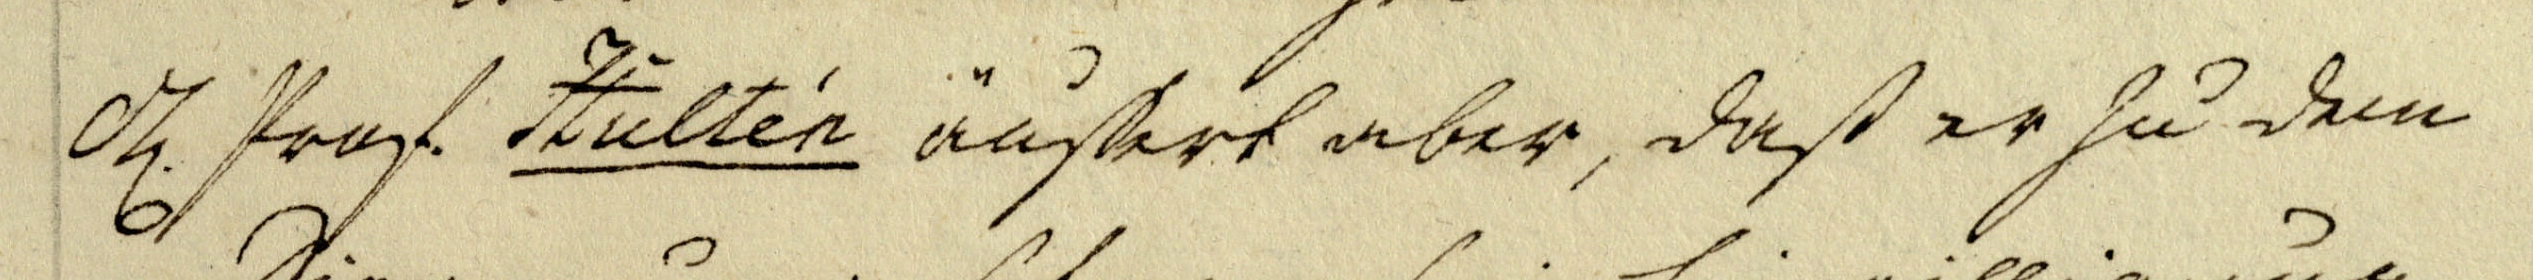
dh. Prof. Hultén äussert aber, daß er zu dem
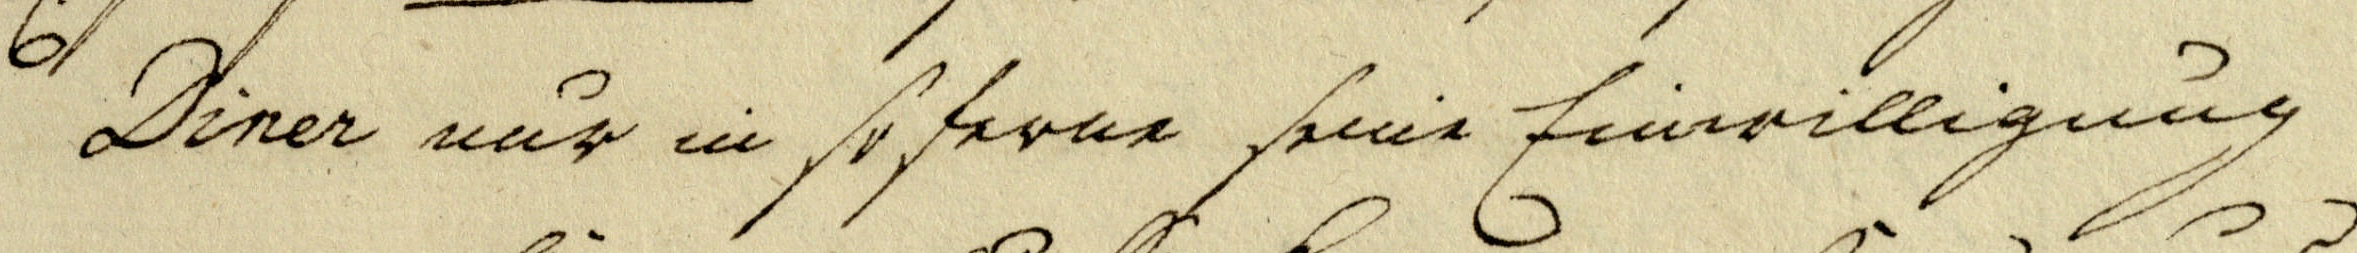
Diner nur in so ferne seine Einwilligung
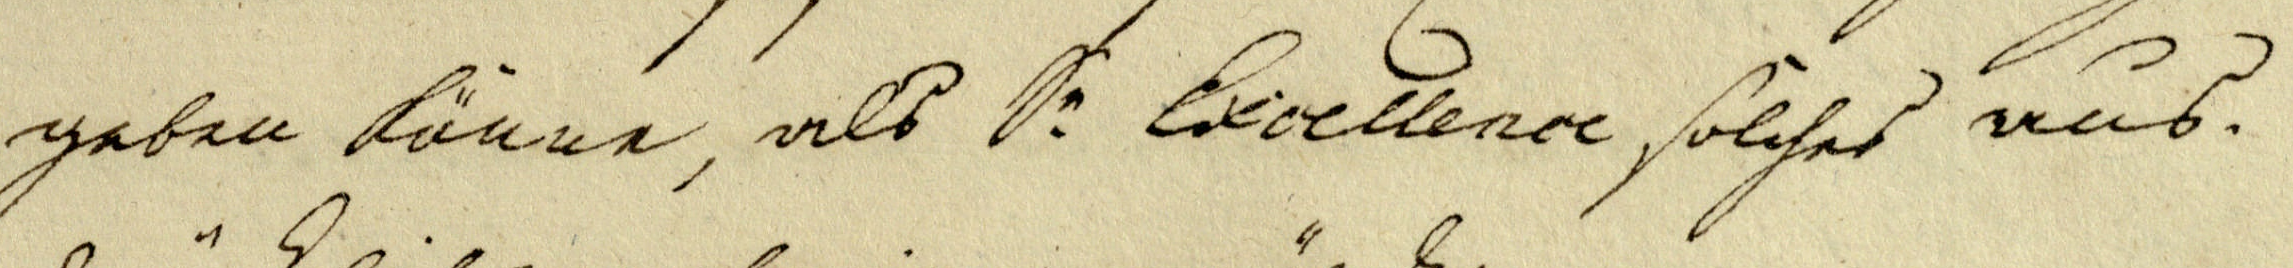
geben könne, als Sr Excellence solches aus¬
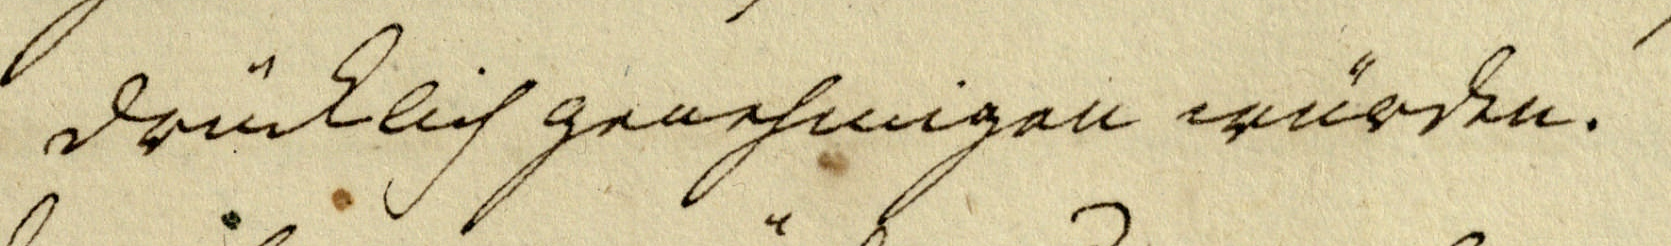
drücklich genehmigen würden.
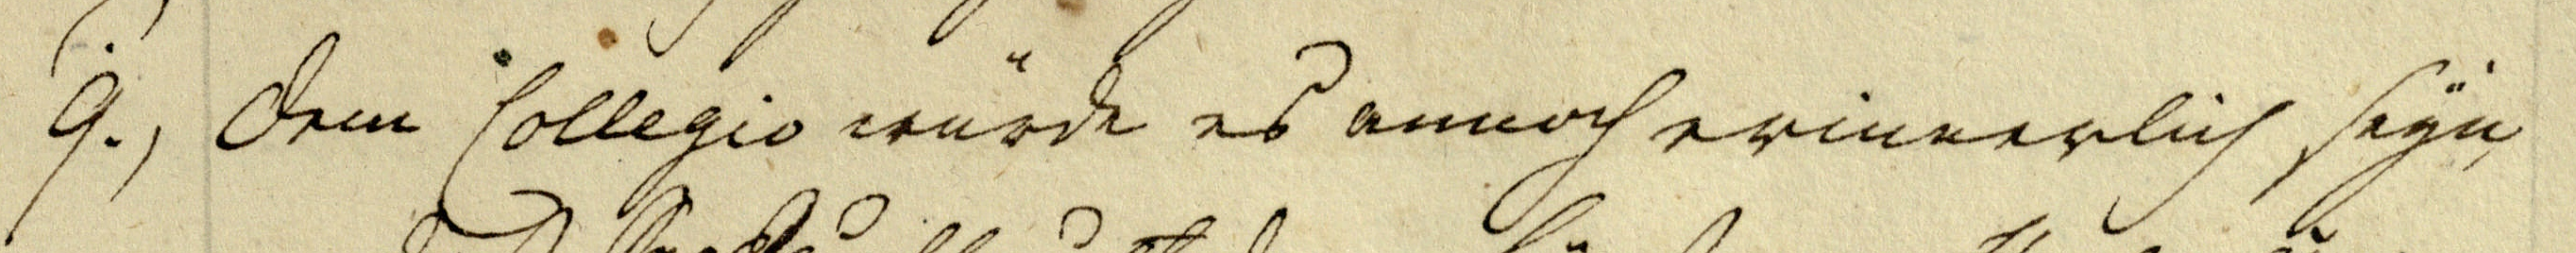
9., Dem Collegio würde es annoch erinnerlich seÿn,
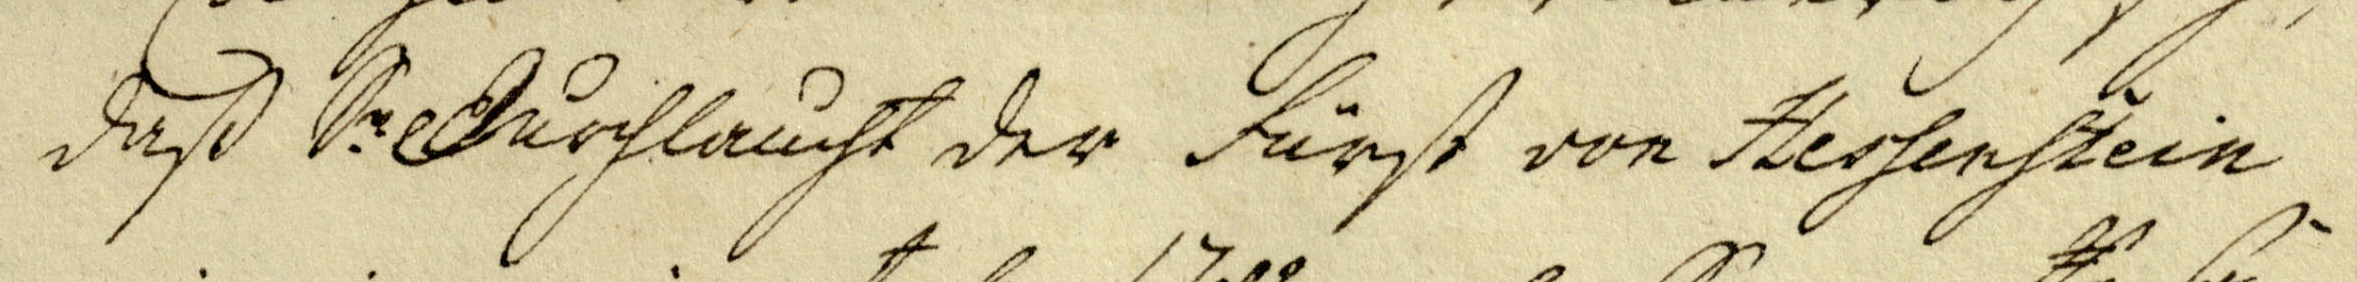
daß Sr Durchlaucht der Fürst von Hessenstein
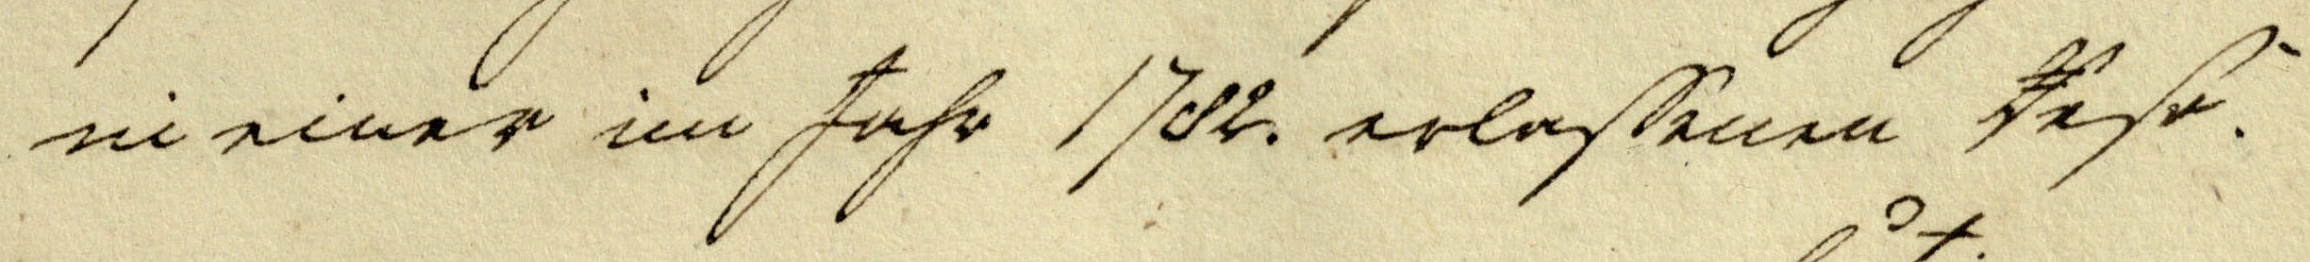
in einer im Jahr 1782. erlassenen Reso¬
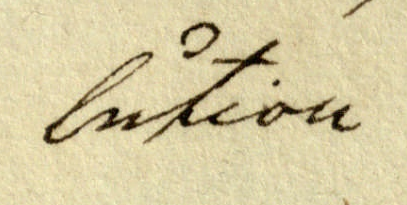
lution
